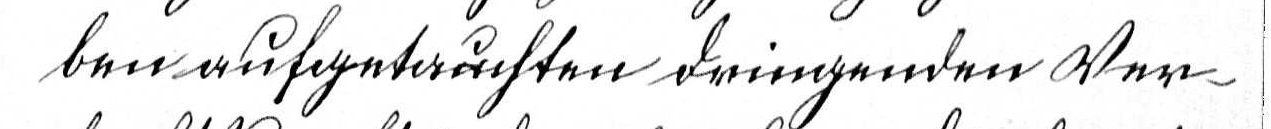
ben aufgetrachten dringenden Ver¬
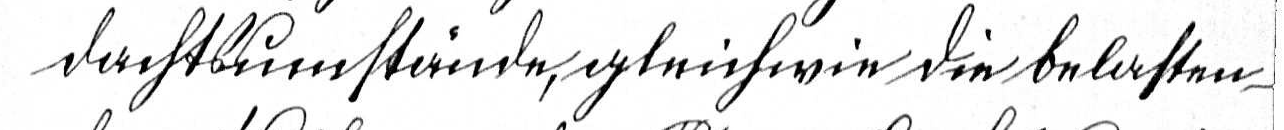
dachtsumstände, gleichwie die belasten¬
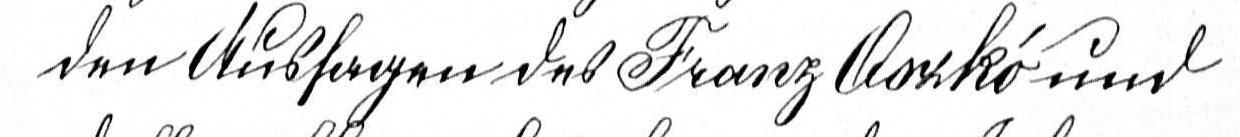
den Aussagen des Franz Oszkó und
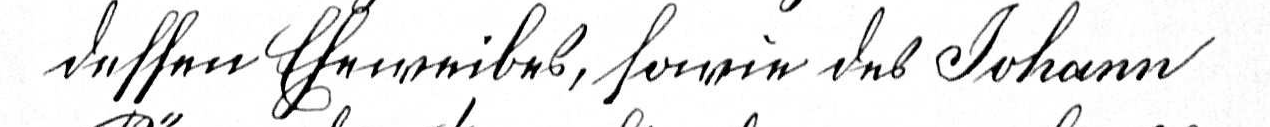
dessen Eheweibes, sowie des Johann
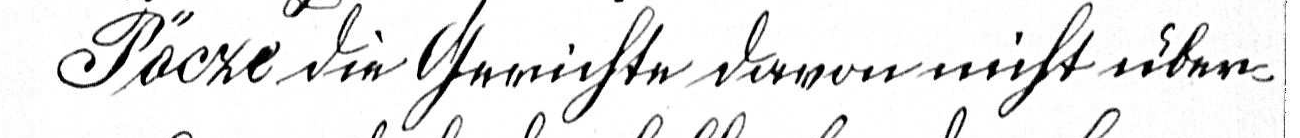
Pöcze die Gerichte davon nicht über¬
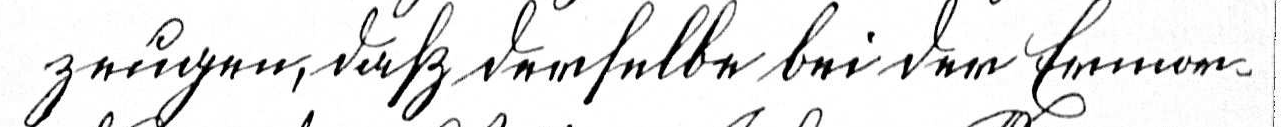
zeugen, daß derselbe bei der Ermor¬
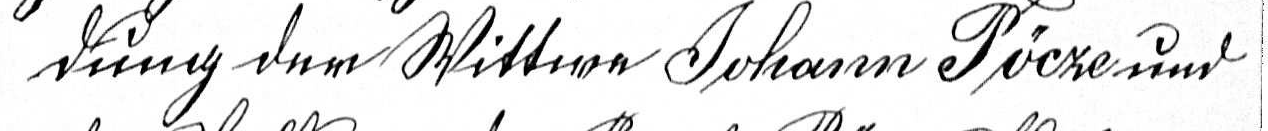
dung der Wittwe Johann Pöcze und
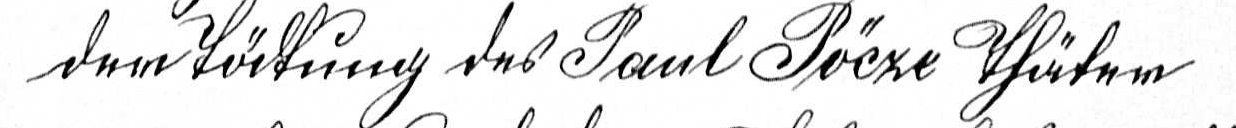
der Tödtung des Paul Pöcze Thäter
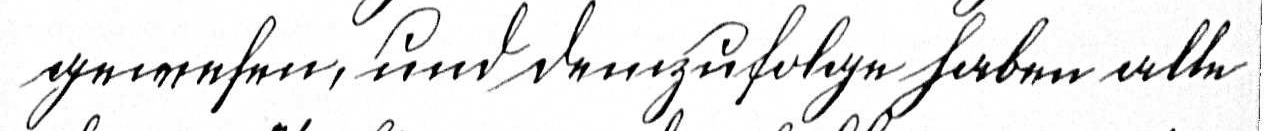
gewesen, und demzufolge haben alle
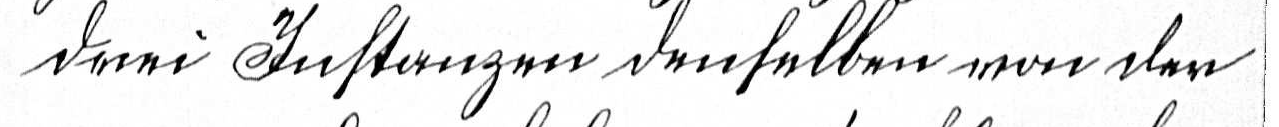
drei Instanzen denselben von der
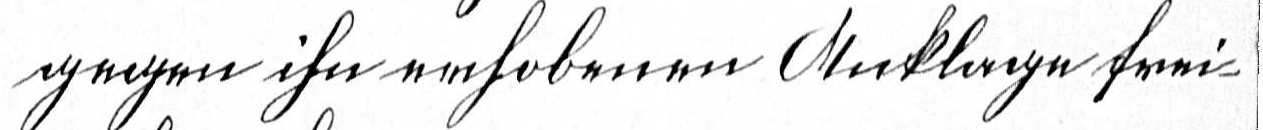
gegen ihn erhobenen Anklage frei¬
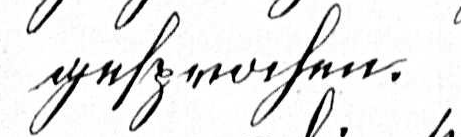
gesprochen.
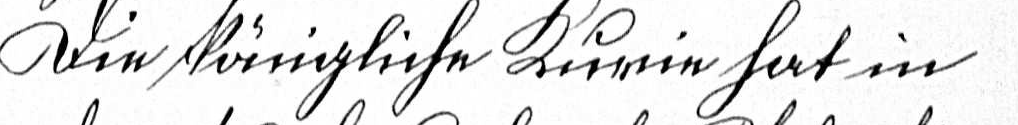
Die königliche Kurie hat in
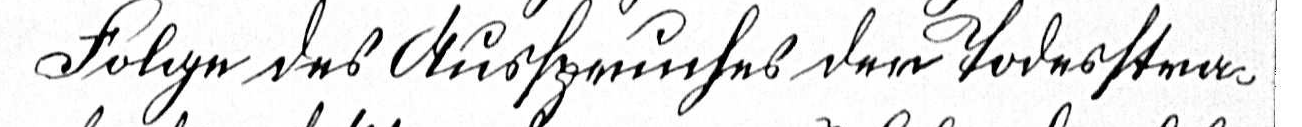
Folge des Ausspruches der Todesstra¬
